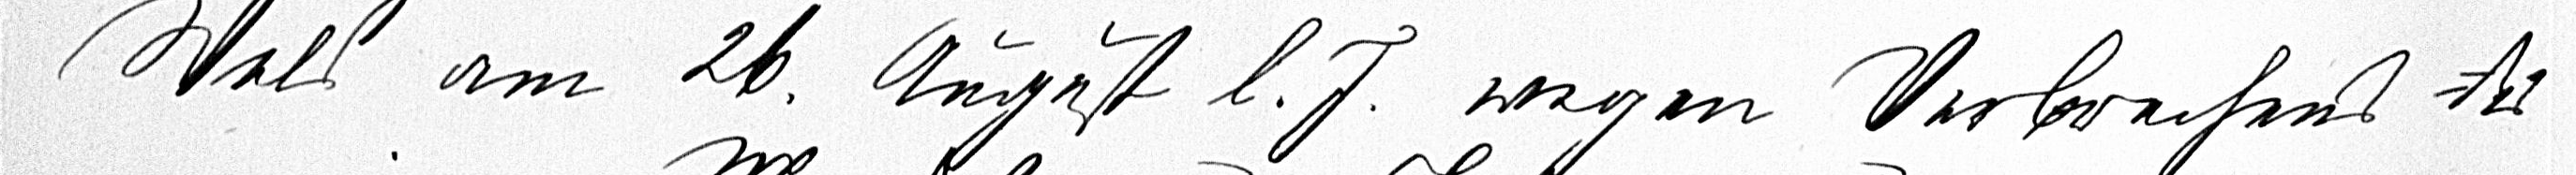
Wels am 26. August l.J. wegen Verbrechens des
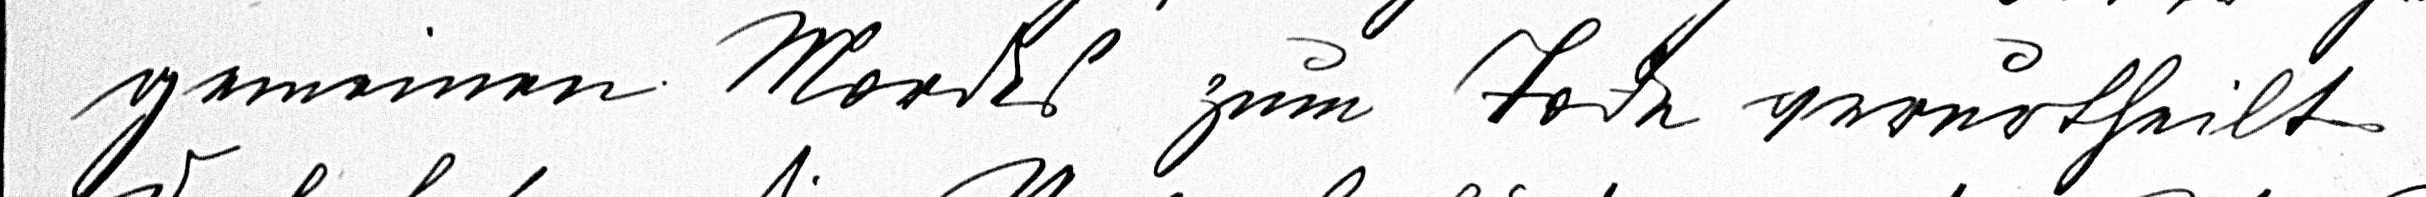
gemeinen Mordes zum Tode verurtheilt
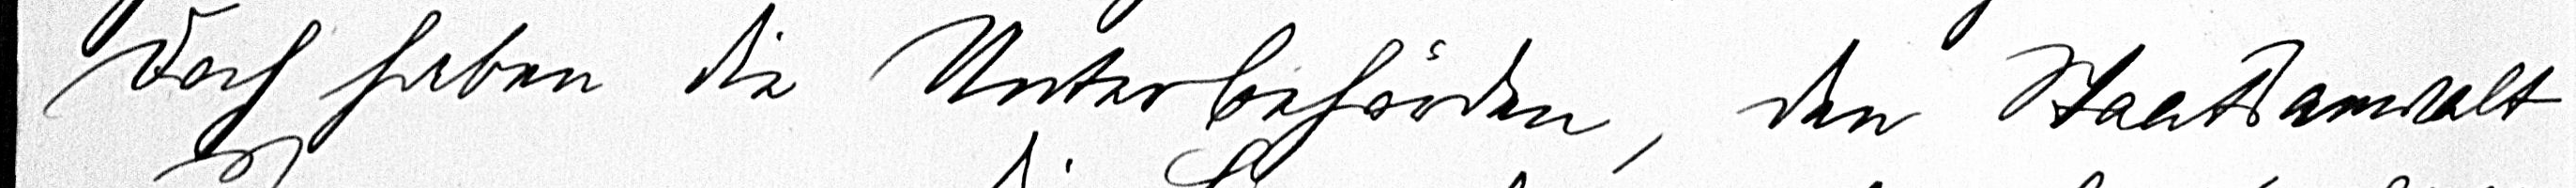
Doch haben die Unterbehörden, den Staatsanwalt
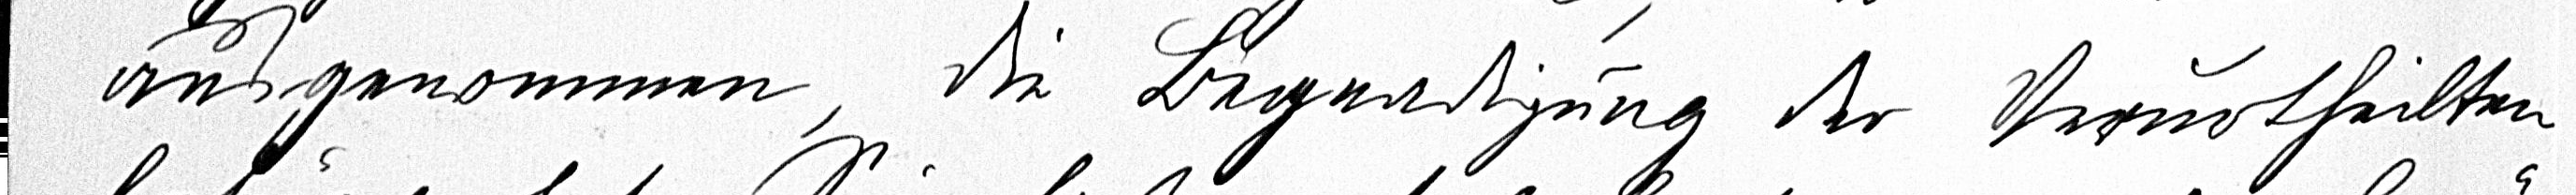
ausgenommen, die Begnadigung der Verurtheilten
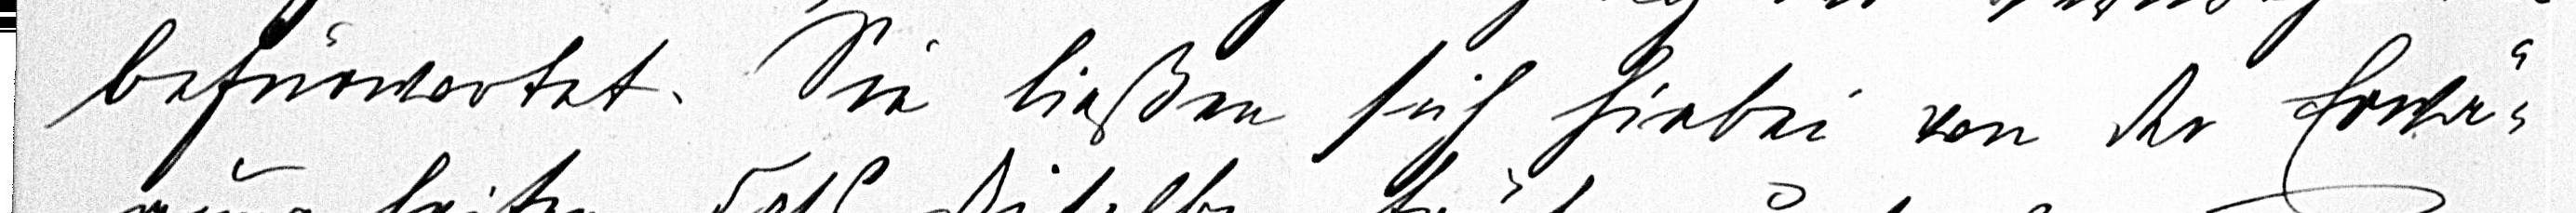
befürwortet. Sie ließen sich hiebei von der Erwä¬
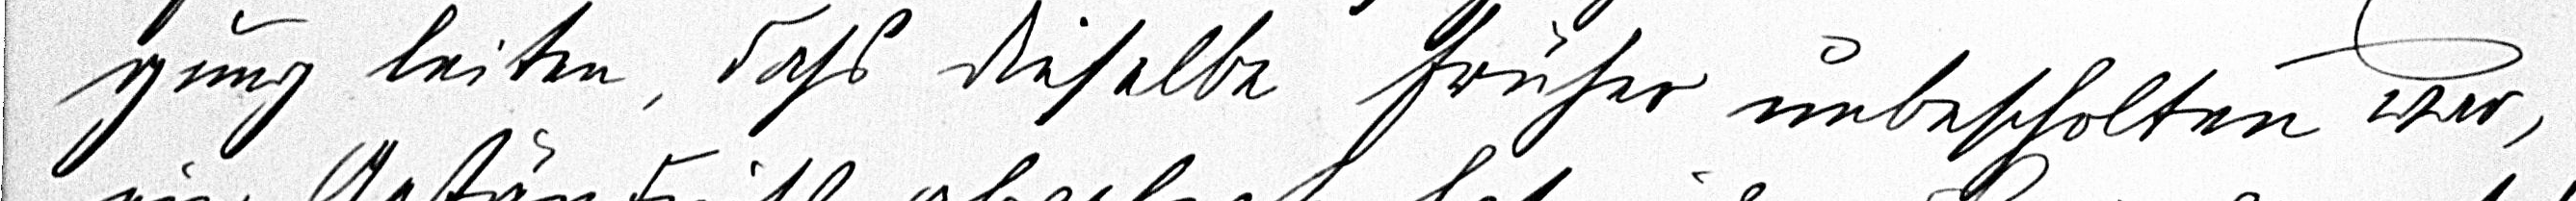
gung leiten, dass dieselbe früher unbescholten war,
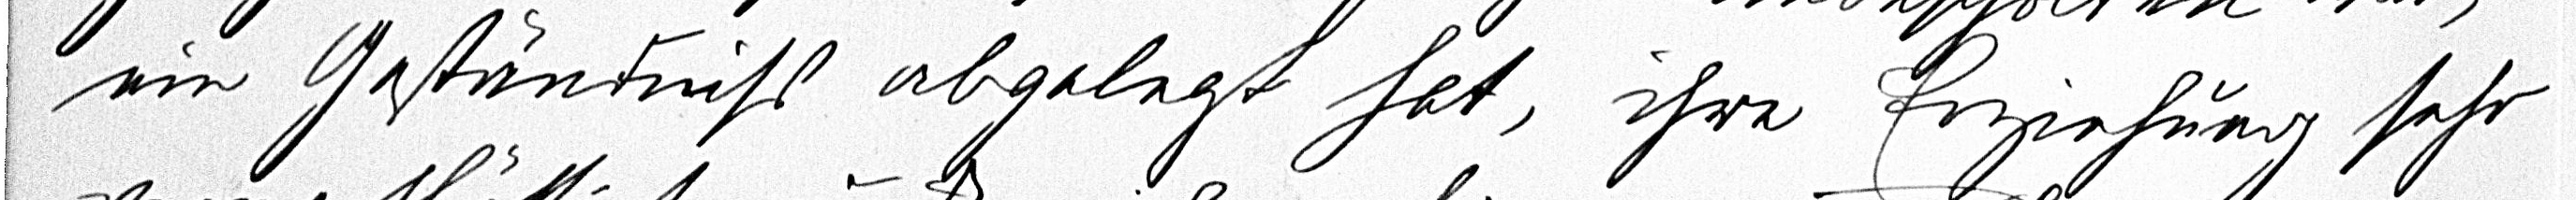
ein Geständniss abgelegt hat, ihre Erziehung sehr
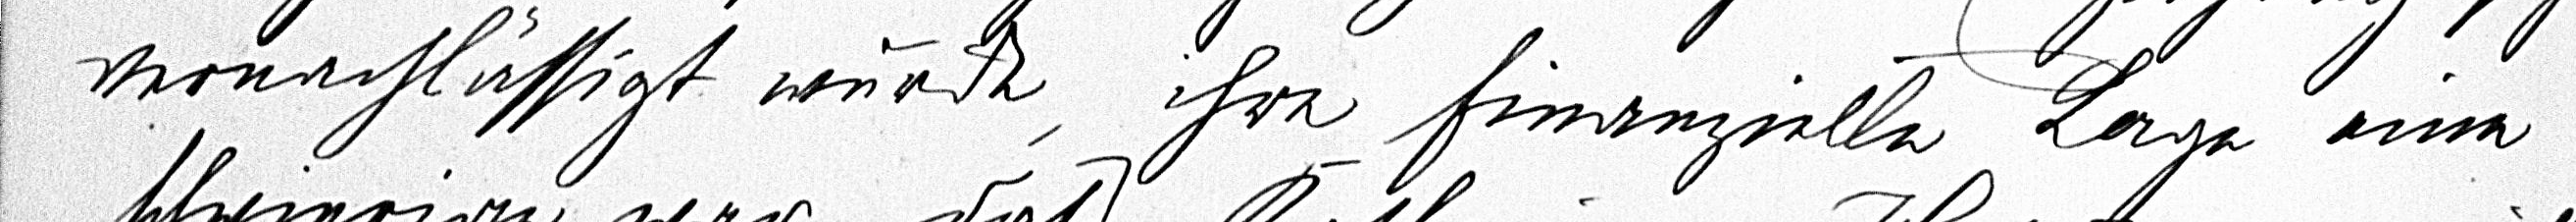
vernachlässigt wurde, ihre Finanzielle Lage eine
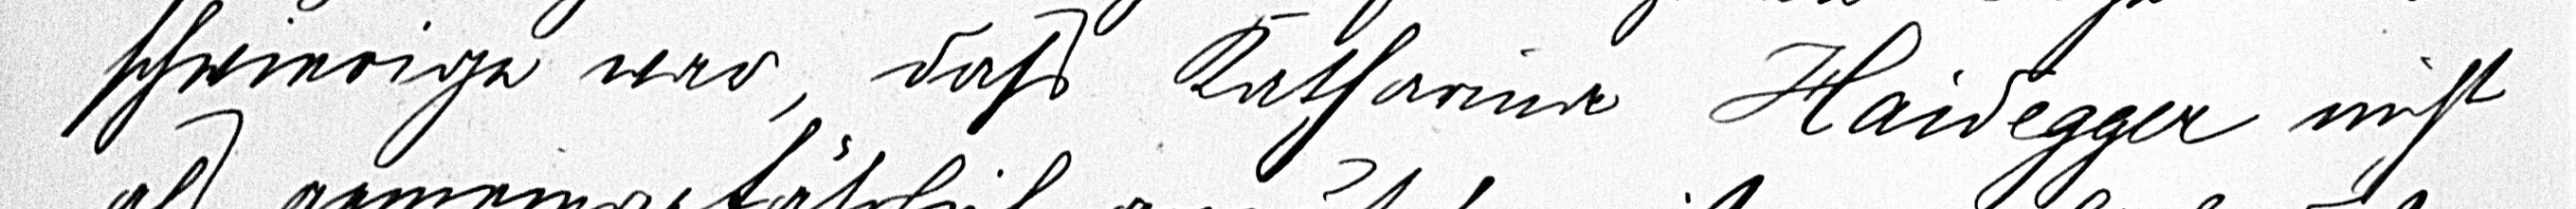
schwierige war, dass Katharina Haidegger nicht
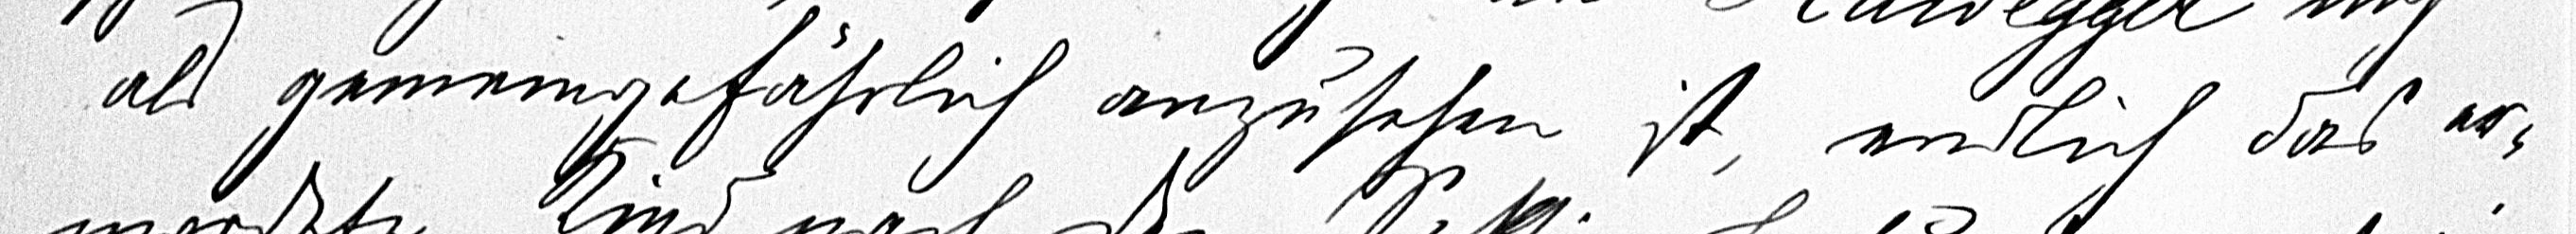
als gemeingefährlich anzusehen ist, endlich das er¬
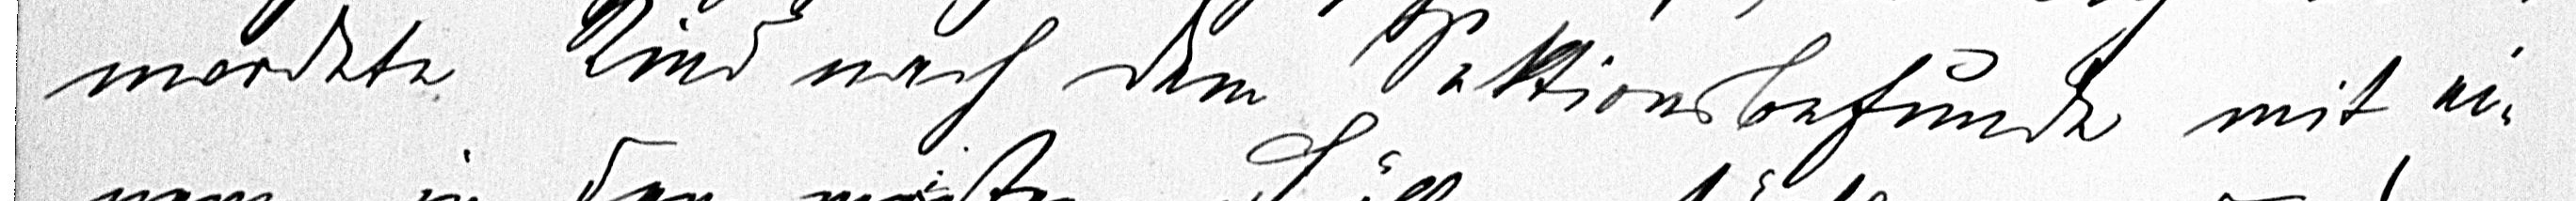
mordete Kind nach dem Sektionsbefunde mit ei¬
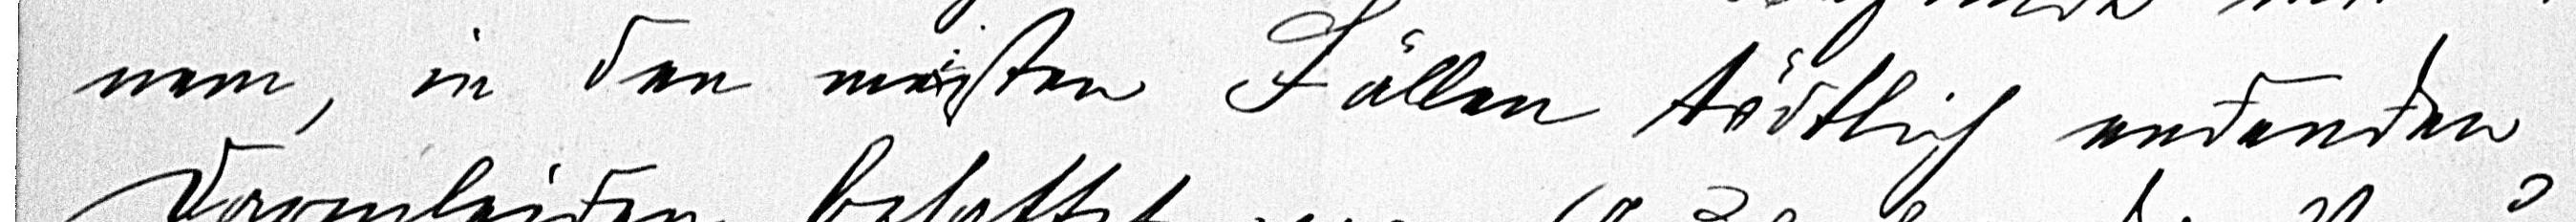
nem, in den meisten Fällen tödtlich endenden
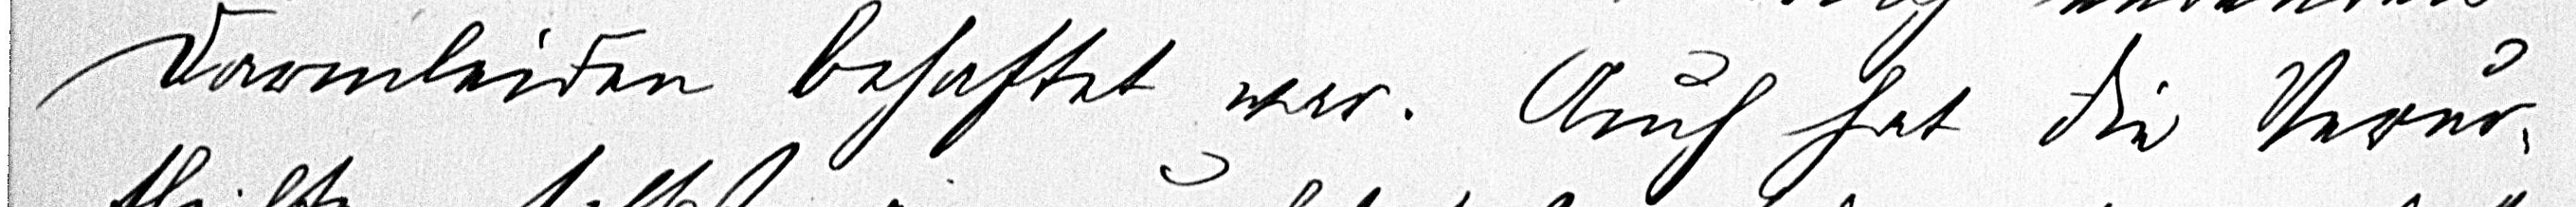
Darmleiden behaftet war. Auch hat die Verur¬
